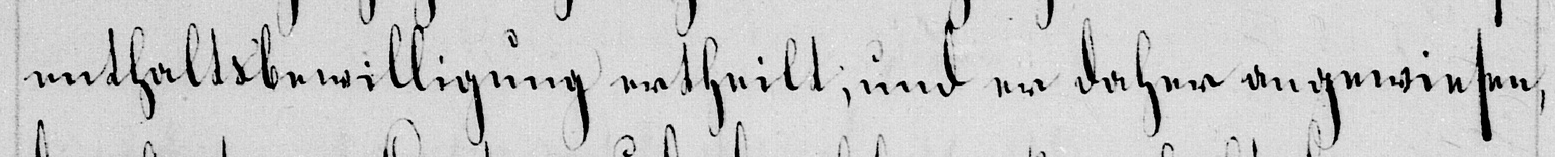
enthaltsbewilligung ertheilt, und er daher angewiesen,
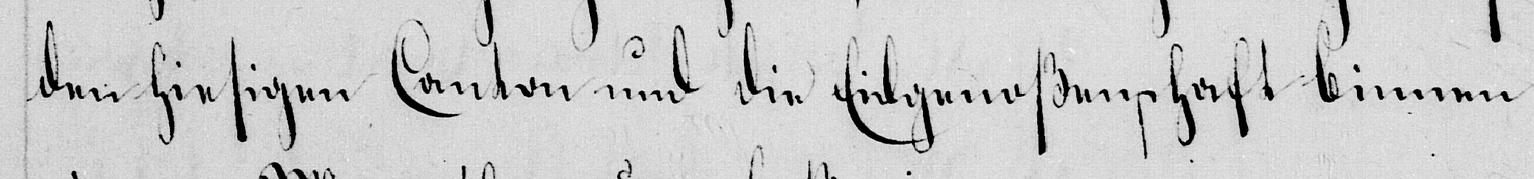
den hiesigen Canton und die Eidgenoßenschaft binnen
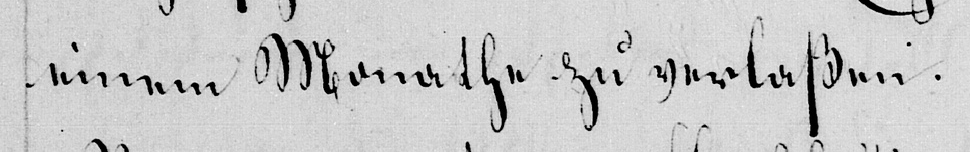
einem Monathe zu verlaßen.
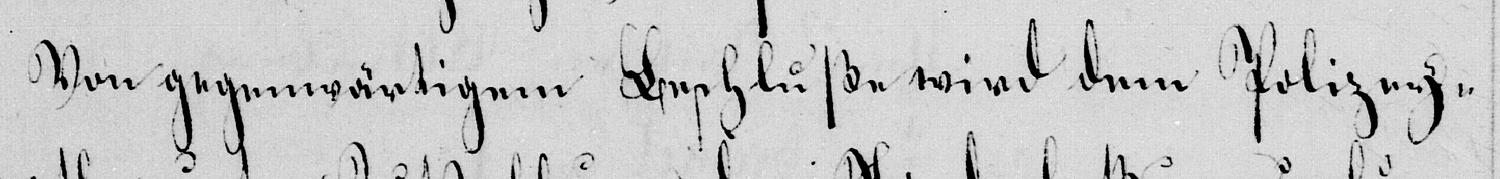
Von gegenwärtigem Beschluße wird dem Polizey¬
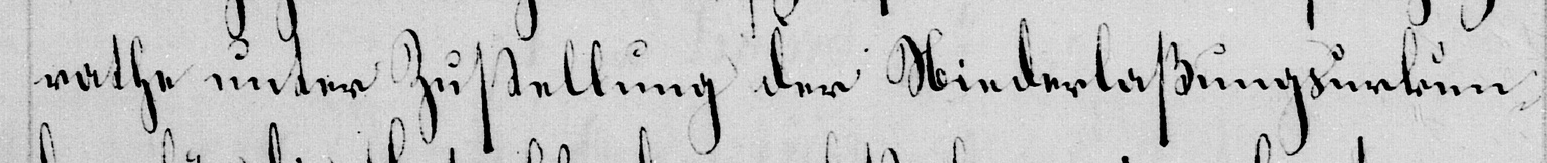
rathe unter Zustellung der Niederlaßungsurkun¬
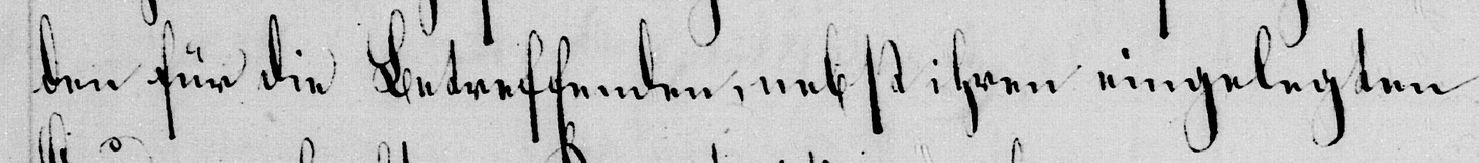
den für die Betreffenden, nebst ihren eingelegten
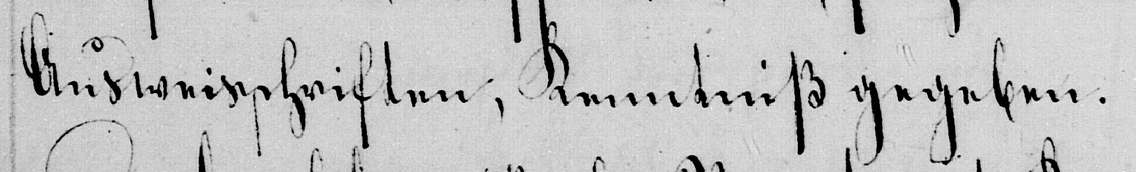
Ausweisschriften, Kenntniß gegeben.
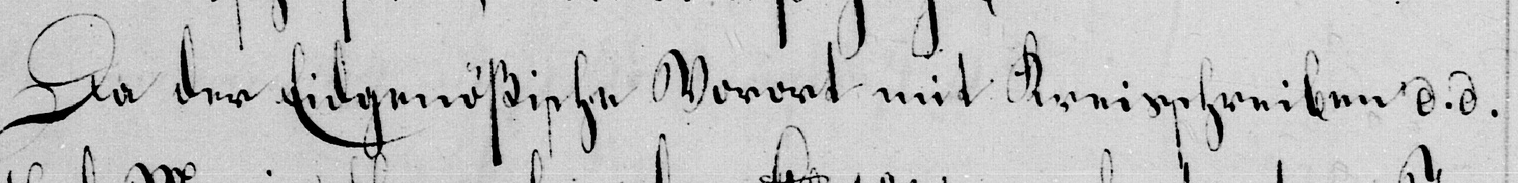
Da der Eidgenößische Vorort mit Kreisschreiben d. d.
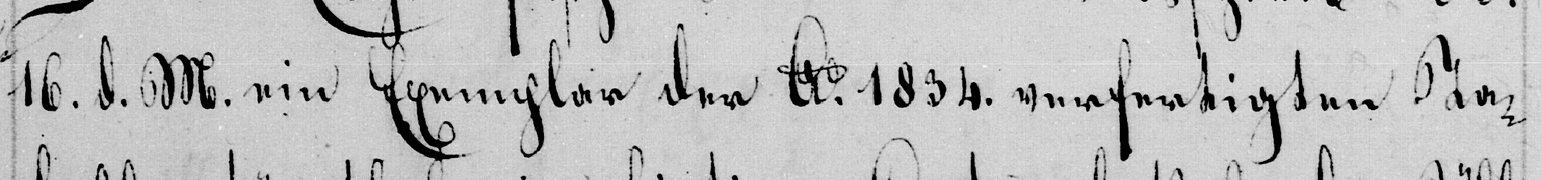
16. d. M. ein Exemplar der Ao. 1834. verfertigten Ta¬
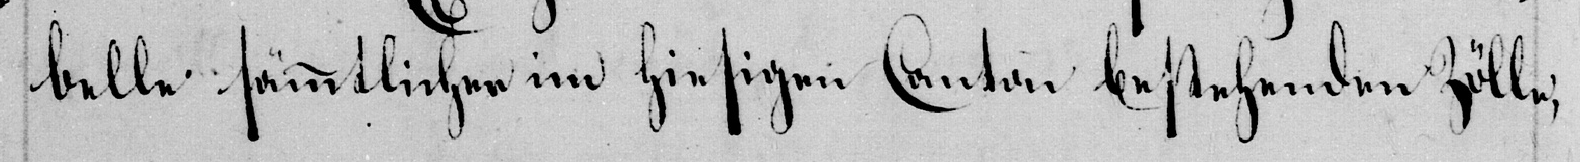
belle sämmtlicher im hiesigen Canton bestehenden Zölle,
